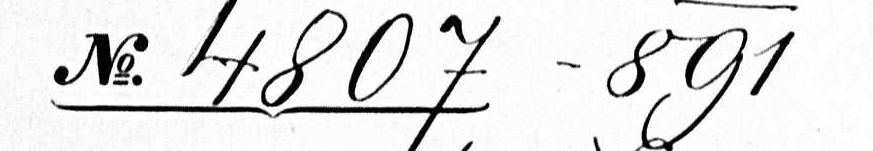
No. 4807 - 1891
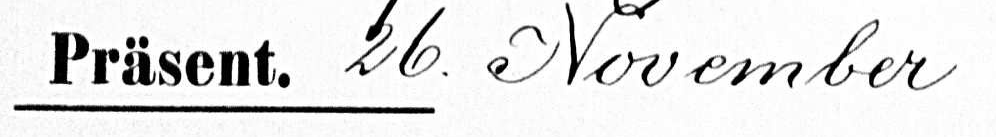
Präsent. 26. November
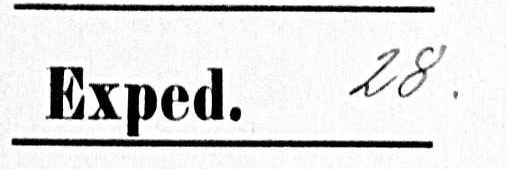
Exped. 28. „
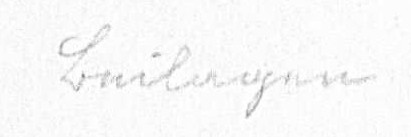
Beilagen
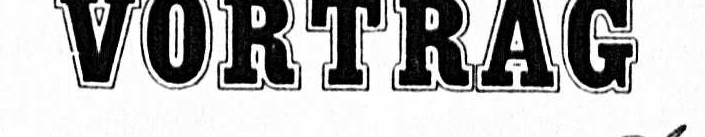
Vortrag
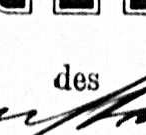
des
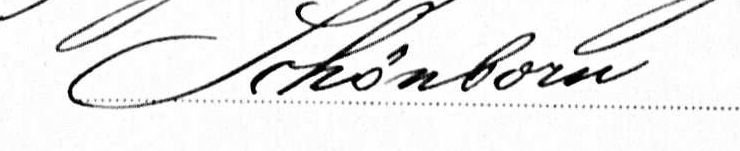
Schönborn
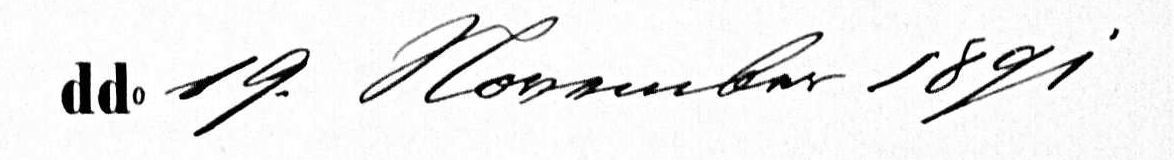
ddo 19. November 1891
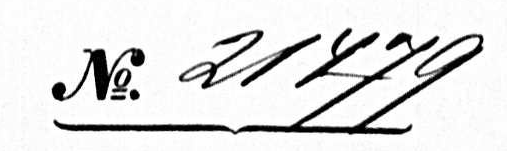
No. 21479
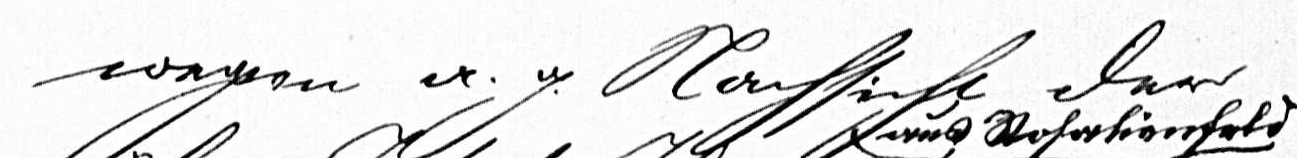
wegen a.g. Nachsicht der
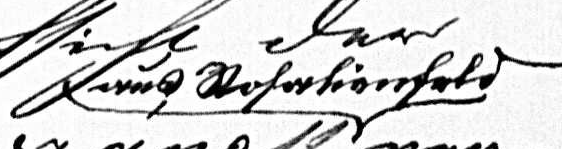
aus Sosalienfeld
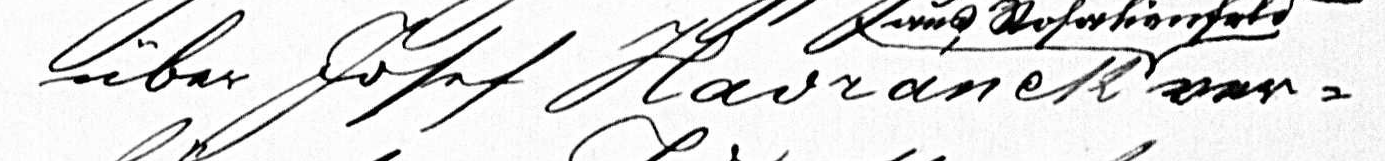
über Josef Havránek ver¬
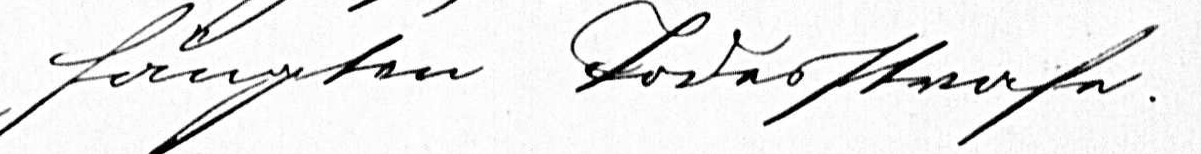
hängten Todesstrafe.
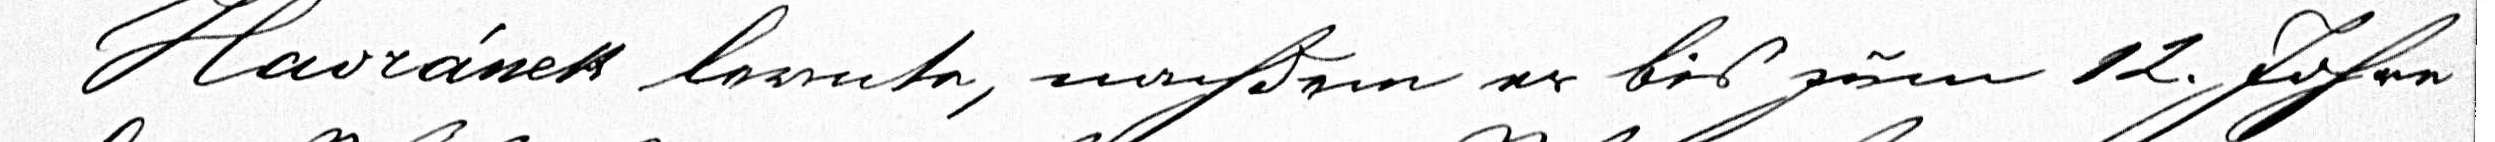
Havránek lernte nachdem er bis zum 12. Jahre
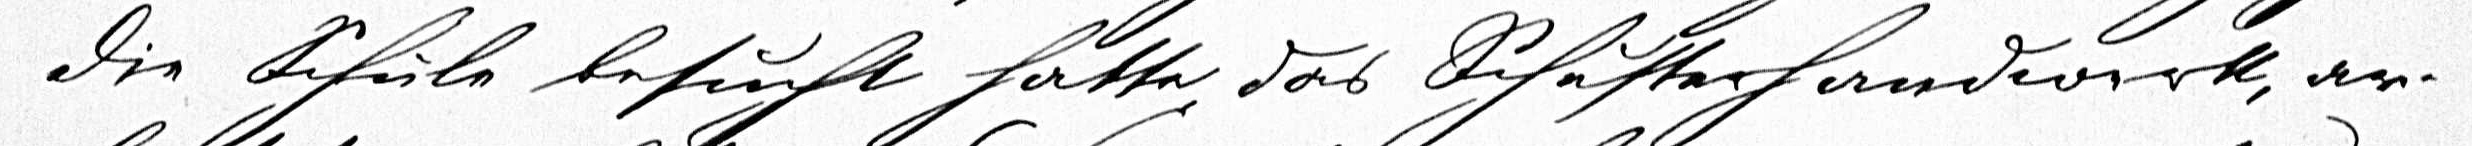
die Schule besucht hatte das Schusterhandwerk, ar¬
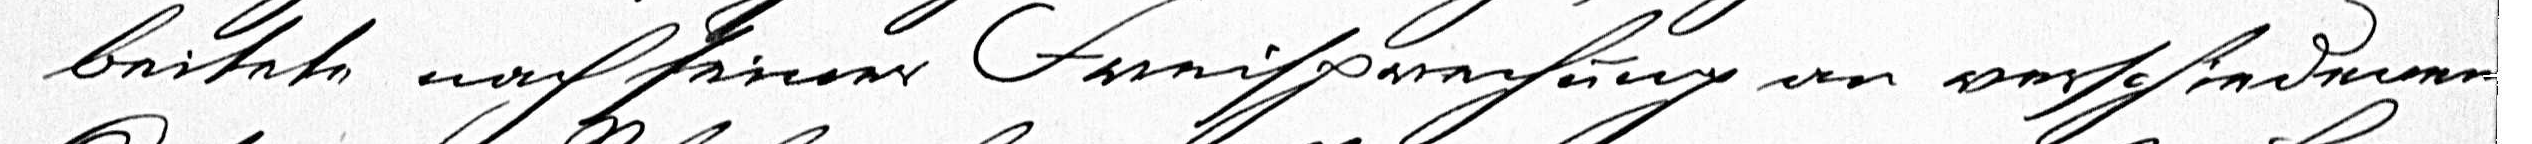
beitete nach seiner Freisprechung an verschiedenen
